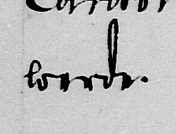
werden.
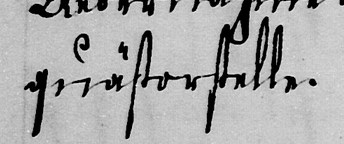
ausgestell¬
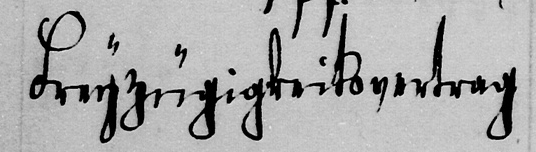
Freyzügigkeitsvetrage
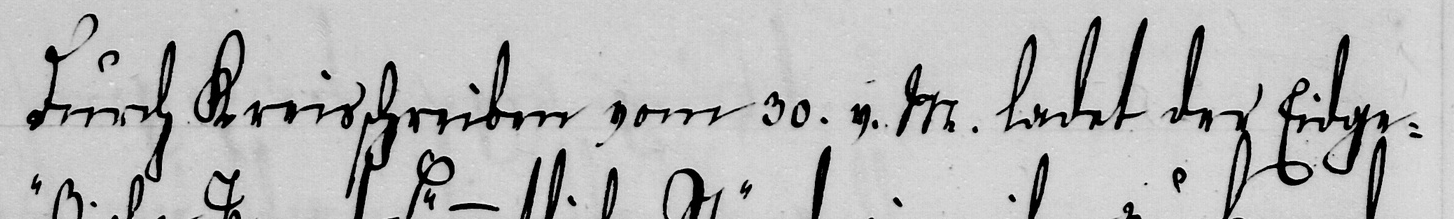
Durch Kreisschreiben vom 30. v. M. ladet der Eidge¬
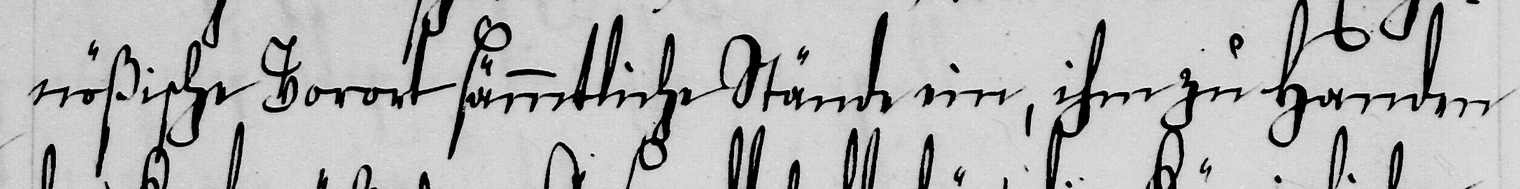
nößische Vorort sämmtliche Stände ein, ihm zu Handen
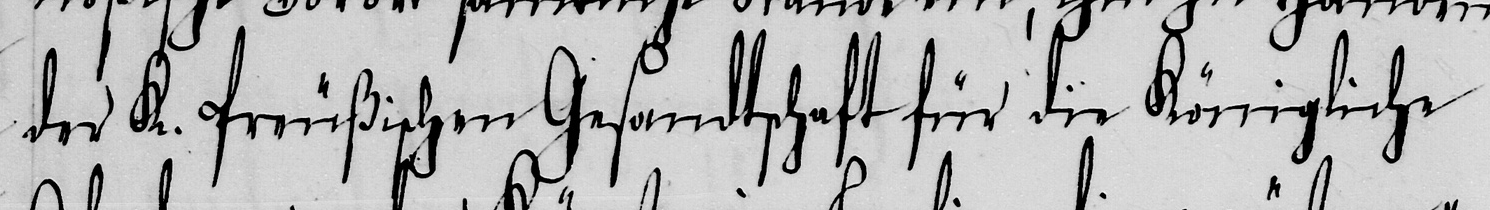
der K. Preußischen Gesandtschaft für die Königliche
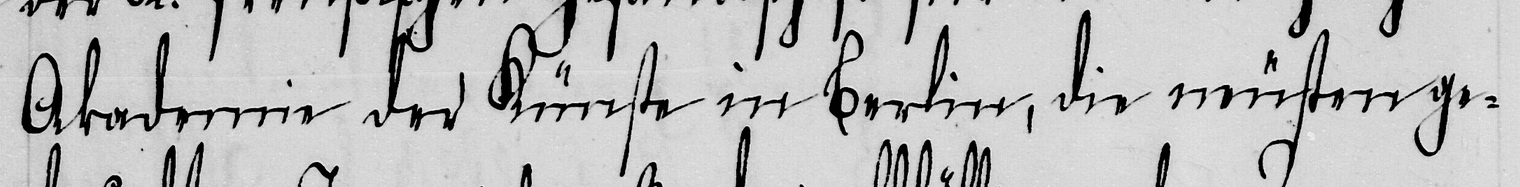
Akademie der Künste in Berlin, die neusten ge¬
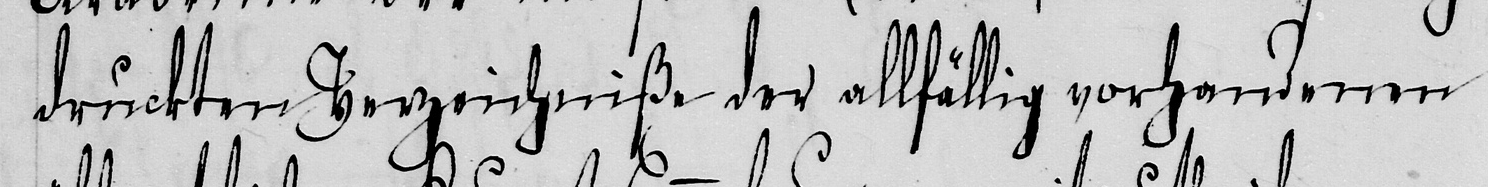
druckten Verzeichniße der allfällig vorhandenen
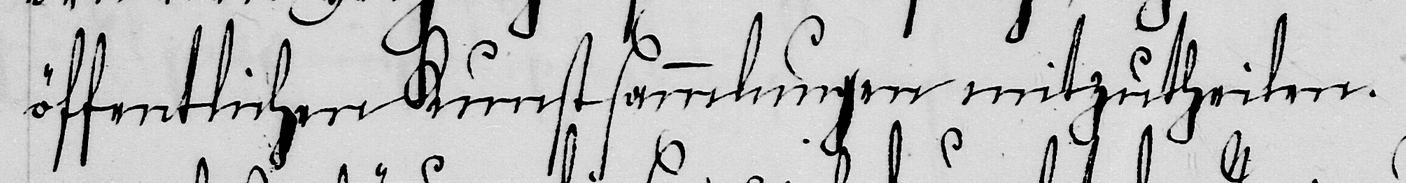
öffentlichen Kunstsammlungen mitzutheilen.
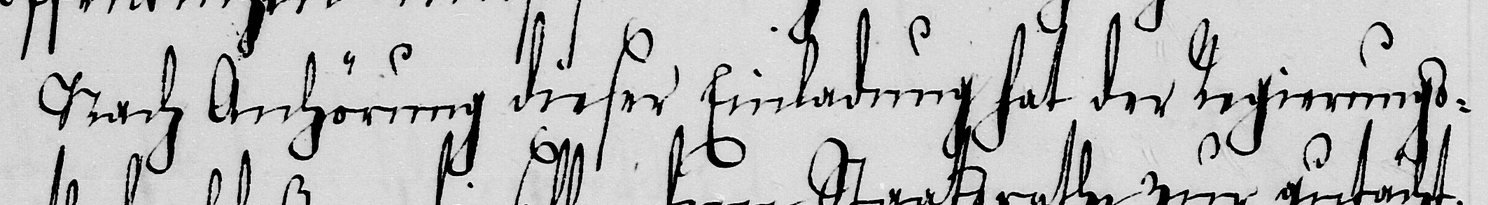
Nach Anhörung dieser Einladung hat der Regierungs¬
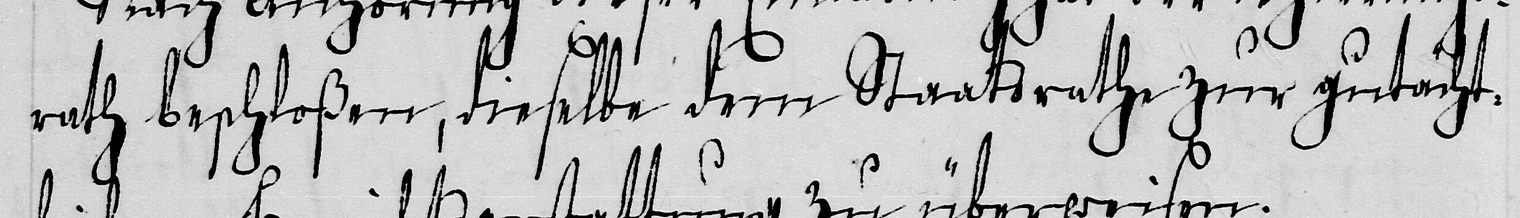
rath beschloßen, dieselbe dem Staatsrathe zur gutächt¬
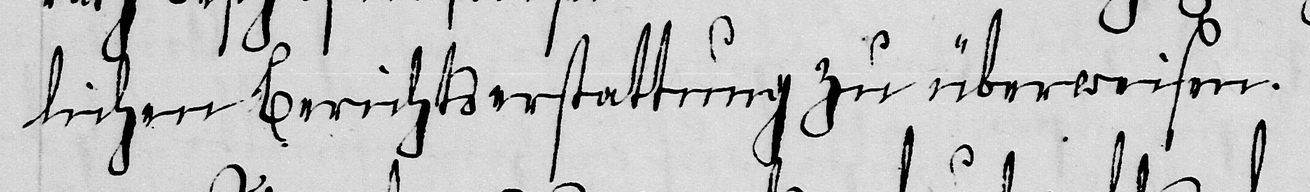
lichen Berichtserstattung zu überweisen.
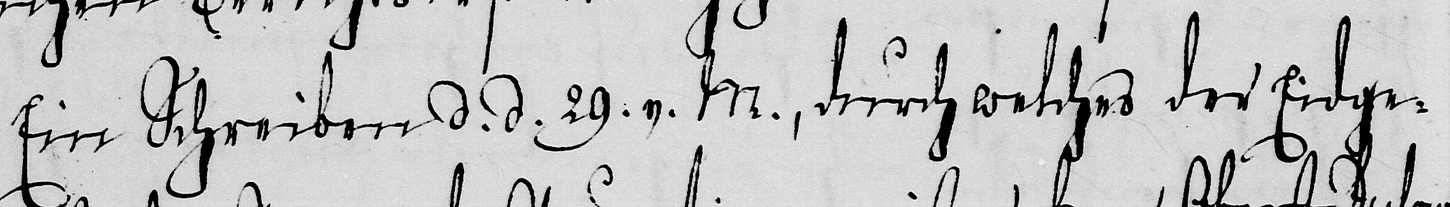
Ein Schreiben d. d. 29. v. M., durch welches der Eidge¬
